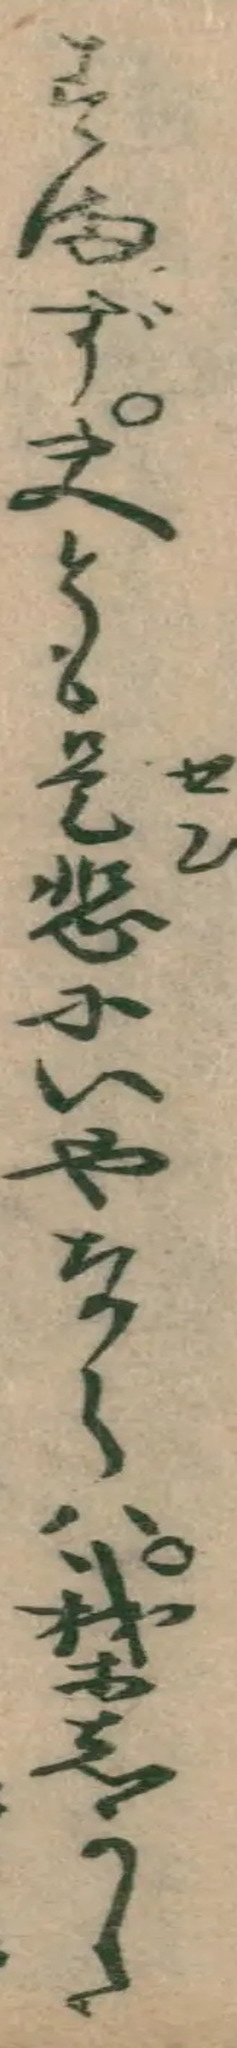すまず。夫とも是悲にいやならは。我等しかた
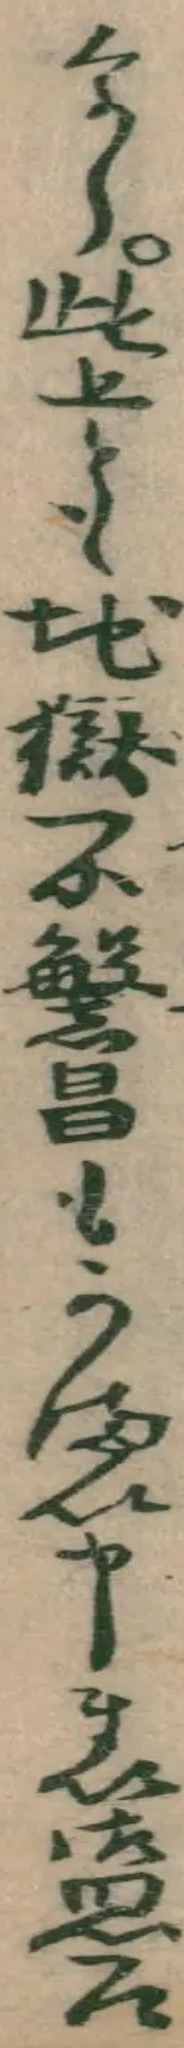なし。此上とも地獄不繁昌もかまい申まい御思召
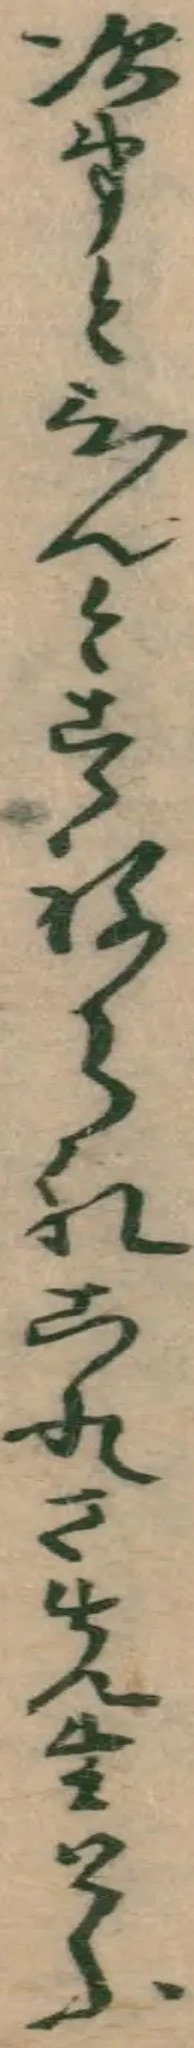次第とひんとすねられこれさ先生とふ
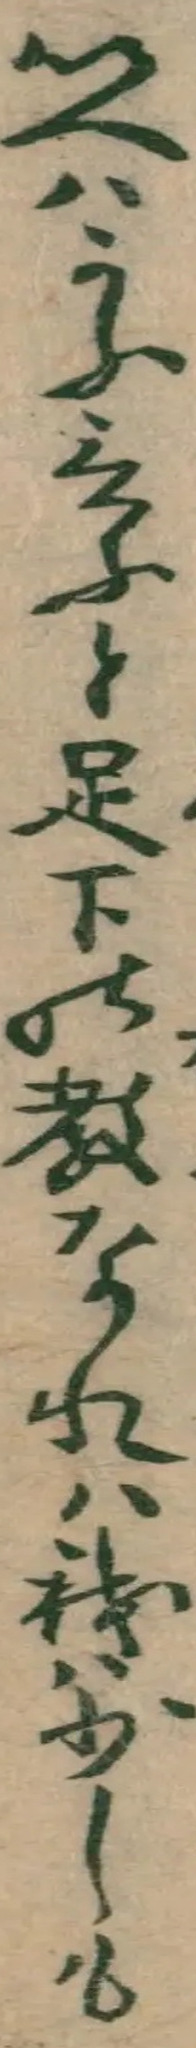いへはかふ言ふと足下の教なれは我は少しも
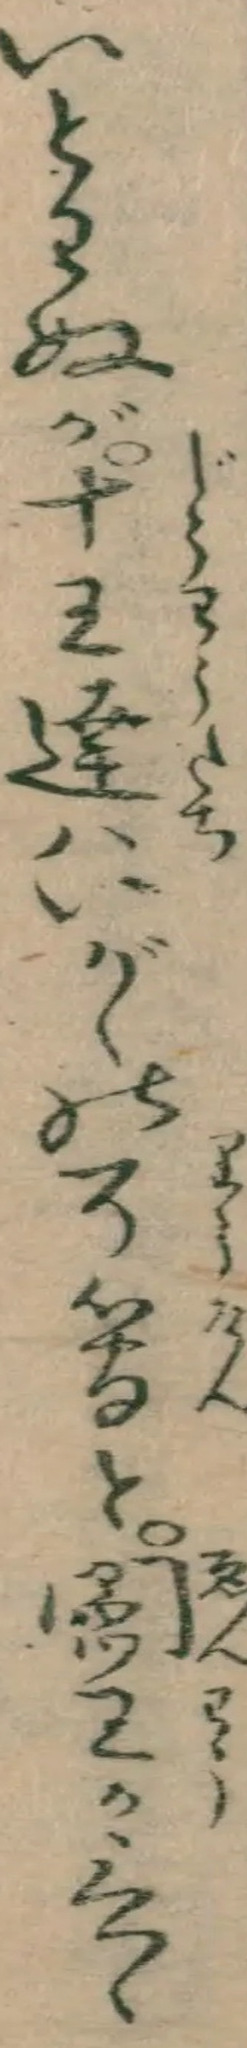いとわぬが。十王達はいがゝの了簡と。閻王か言ゝ
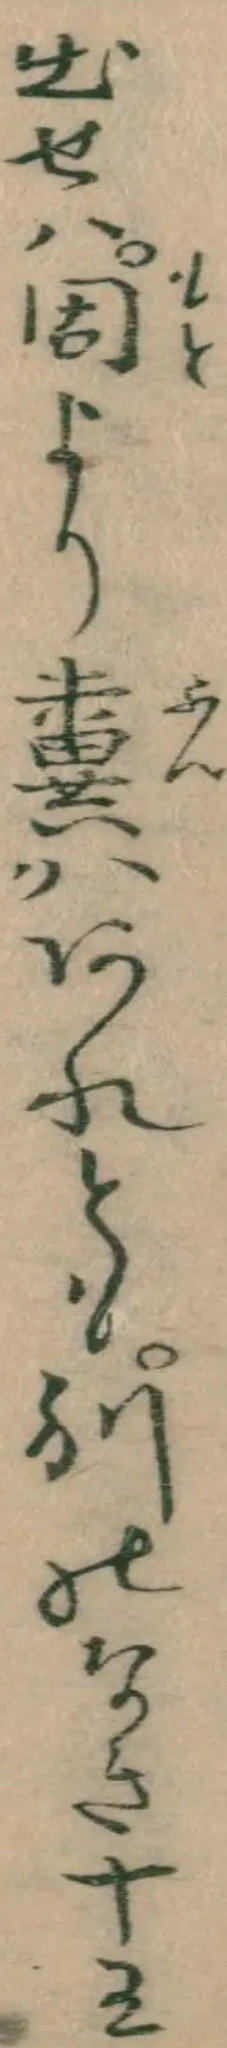出せは。固より糞はあれとも。別のなき十王
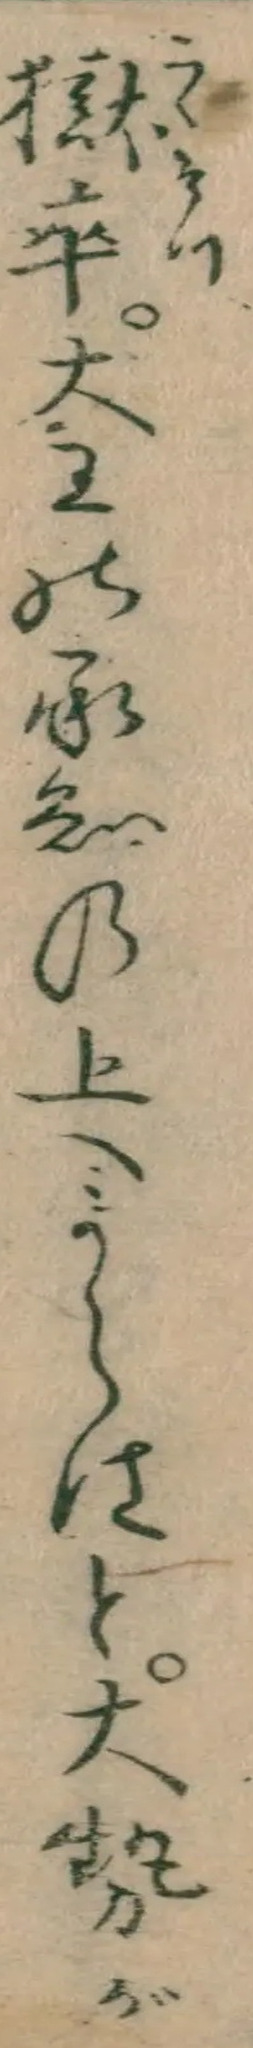獄卒。大王の承知の上へからはと。大勢が
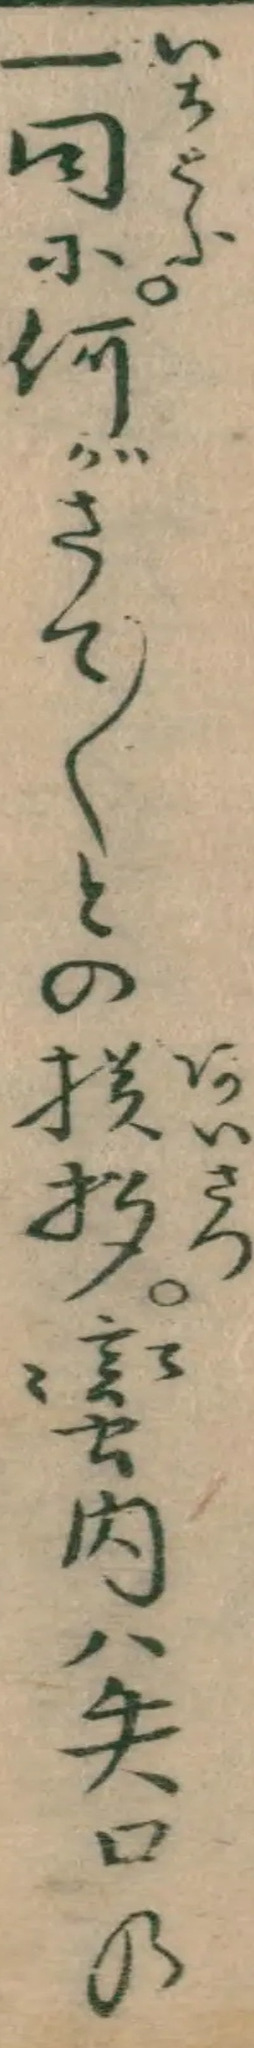一同に。何がさて〳〵との挨拶。蛮内は矢口の
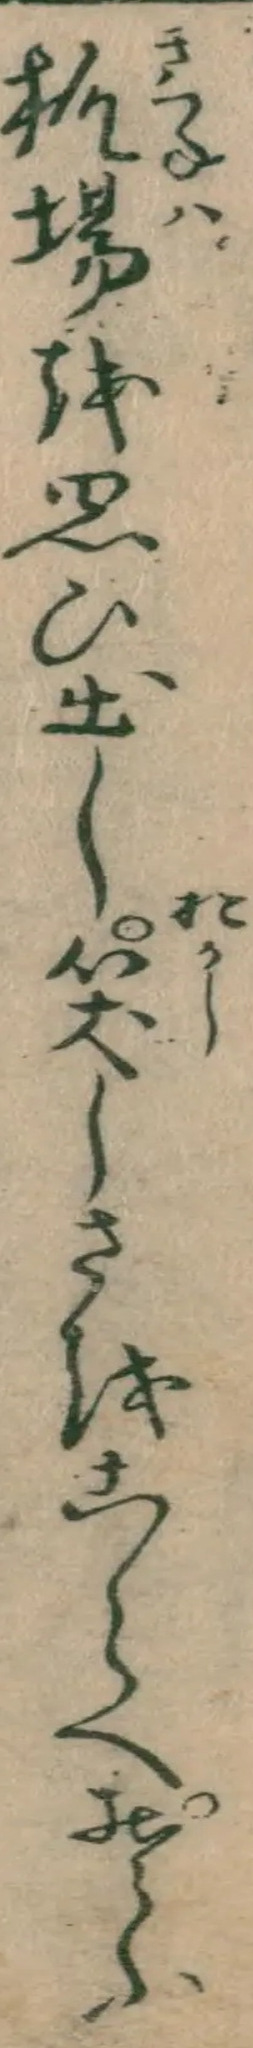狐場を思ひ出し笑しさをこらへ。そふ
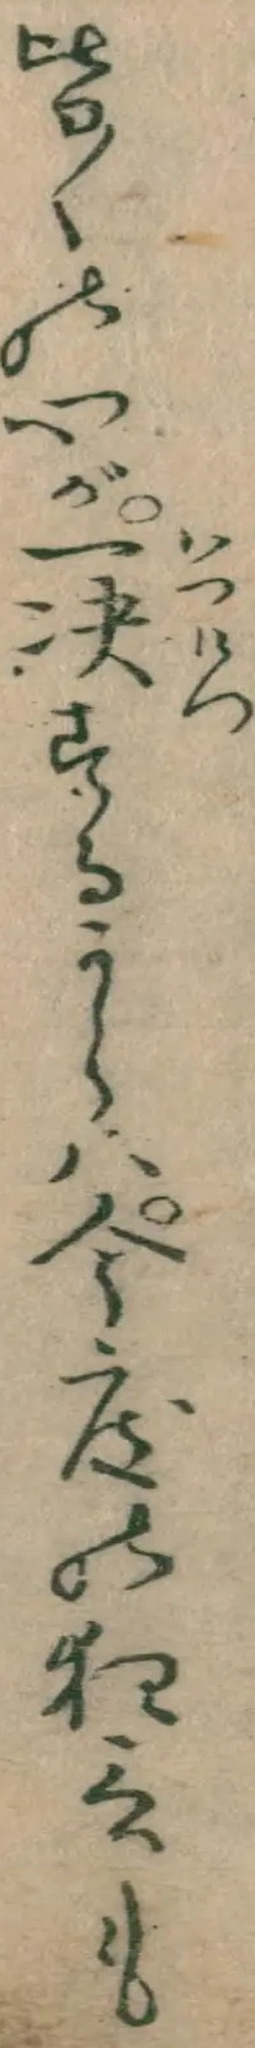皆々の心が。一決するからは。今度の狂言も
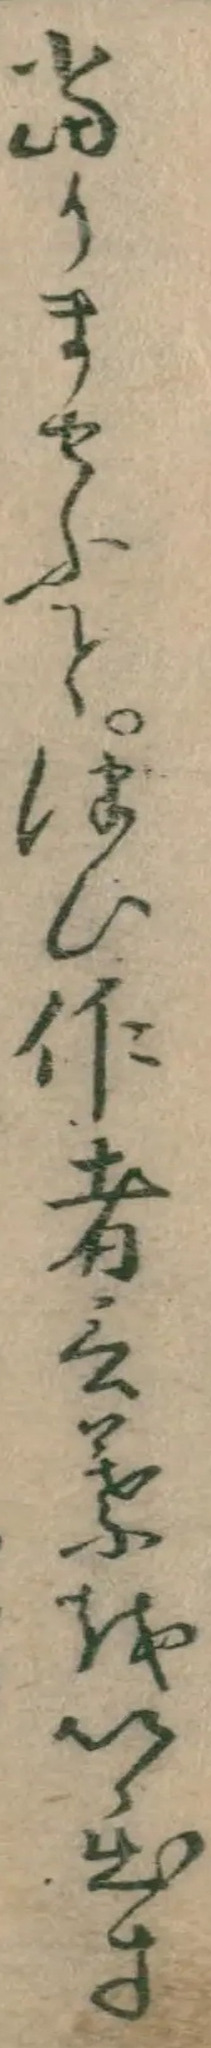当りませうと。つひ作者言葉をいゝ出す
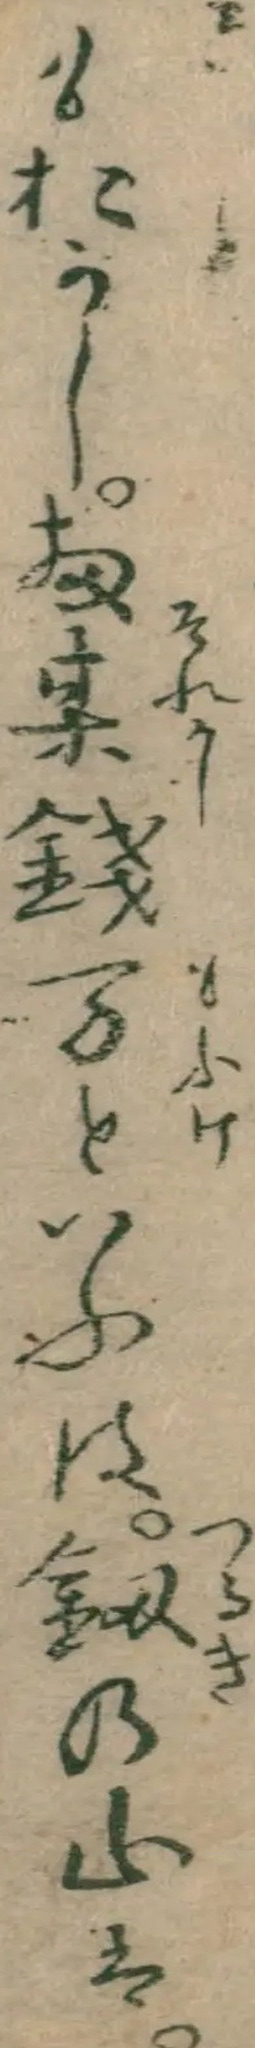もおかし。扨某銭万といふは。釼の山は。

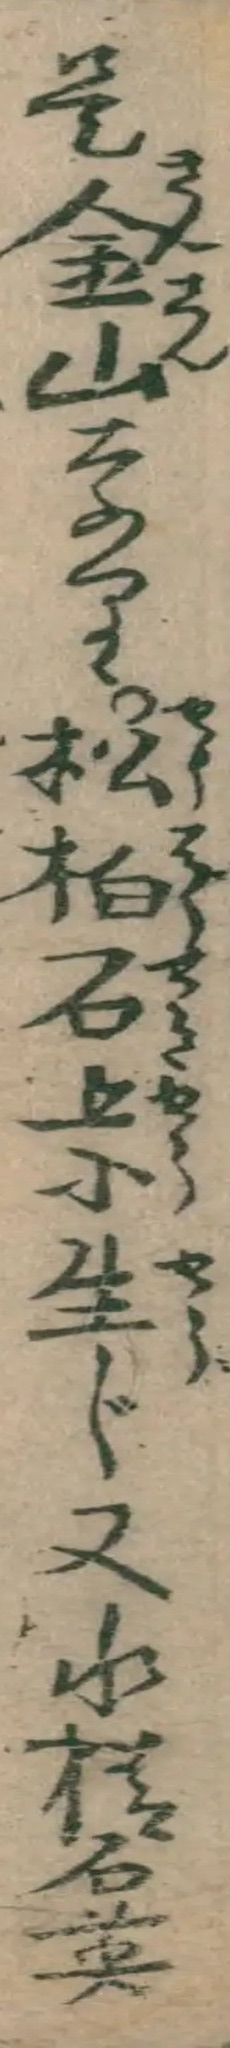是金山なり。松柏石上に生じ又水精石英
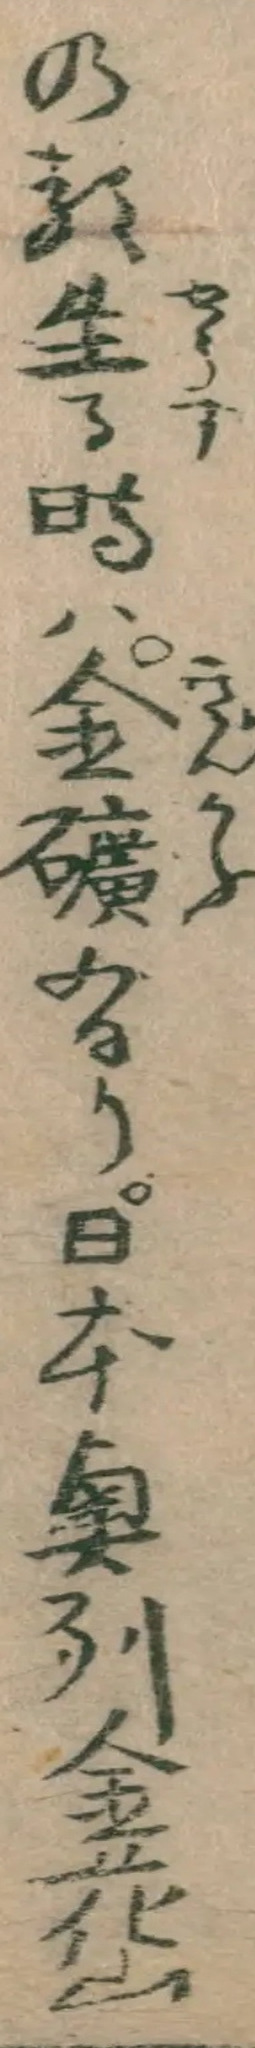の類生る時は。金礦有り。日本奥州金花山
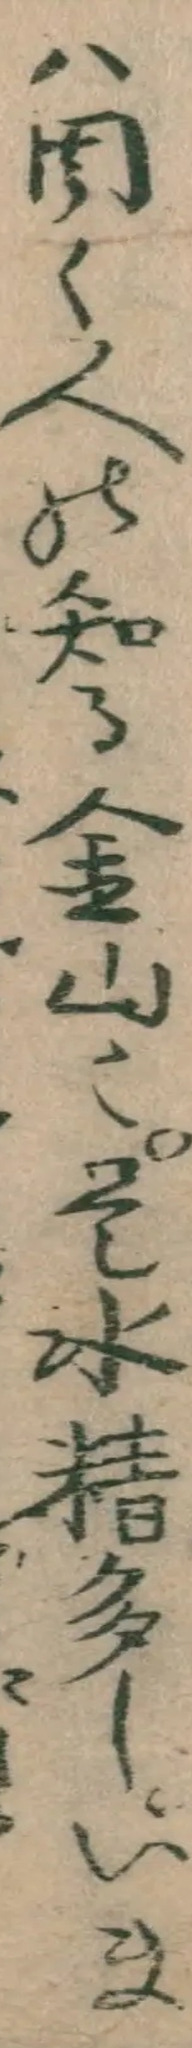は周く人の知る金山也。是水精多し。いま
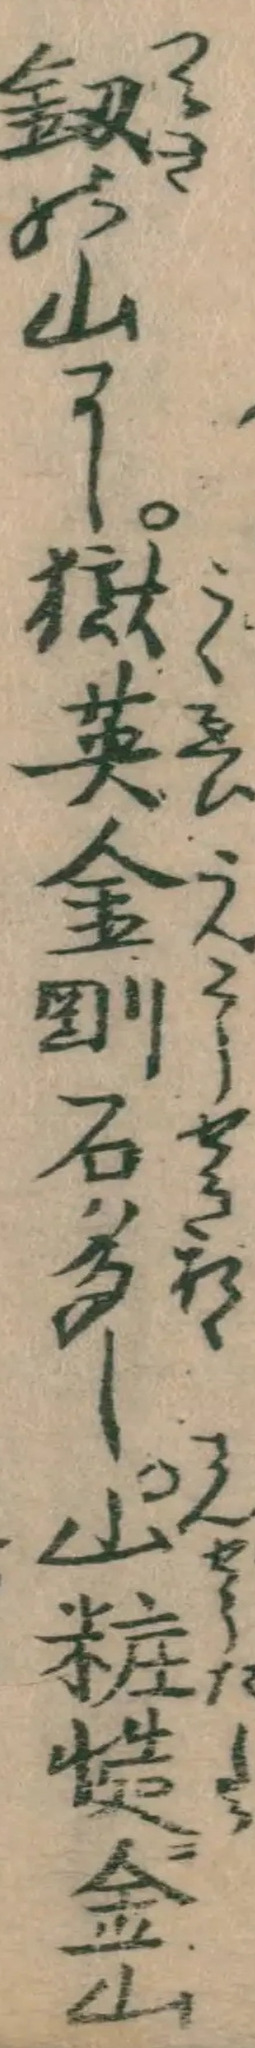釼の山に。獄英金剛石多し。山粧慥金山
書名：翻草盲目
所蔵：国立国会図書館 National Diet Library, JAPAN
